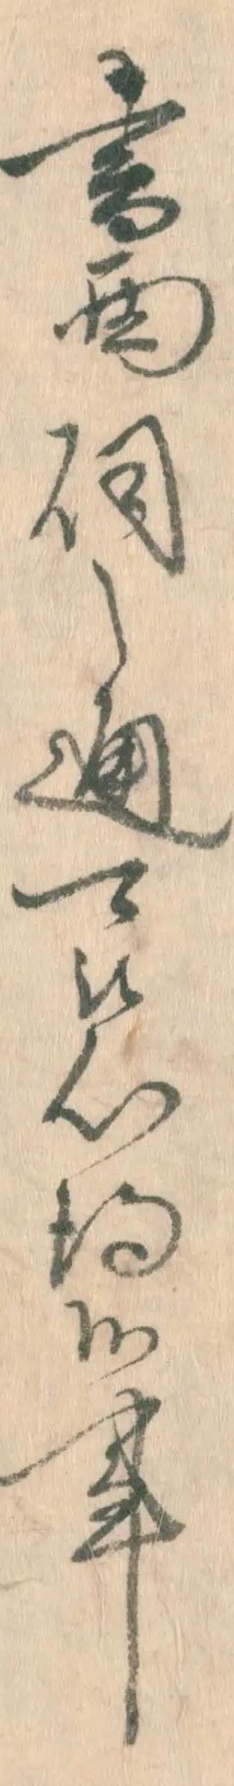書面伺之通可被心得候事
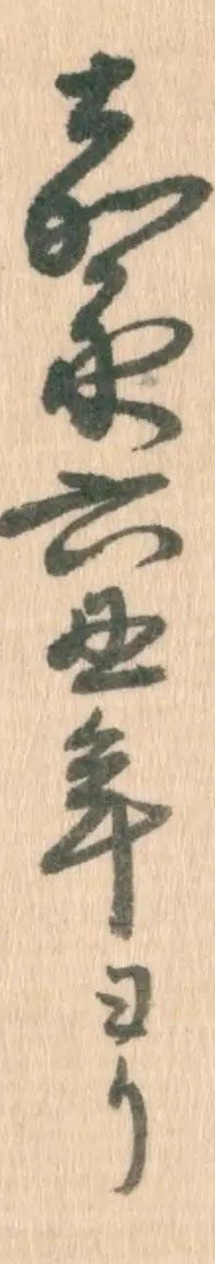嘉永六丑年ヨリ
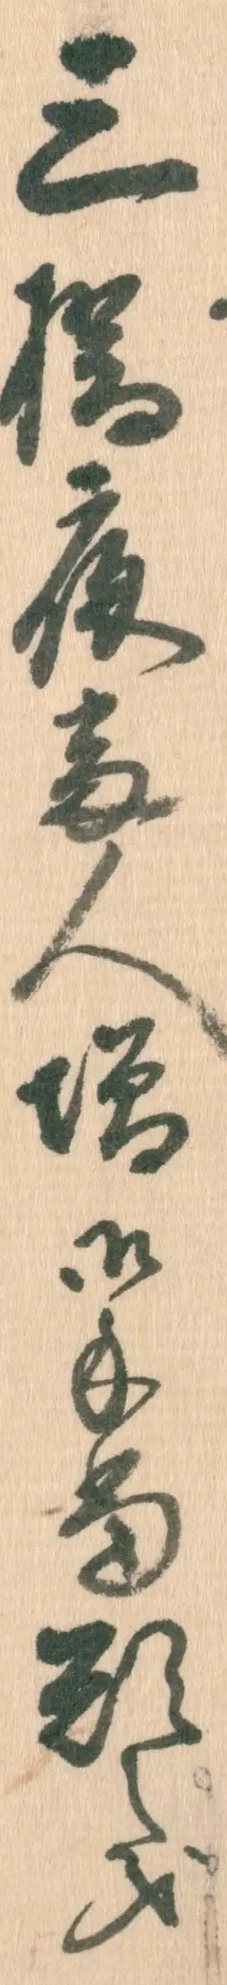三橋夜番人増御手当願之義
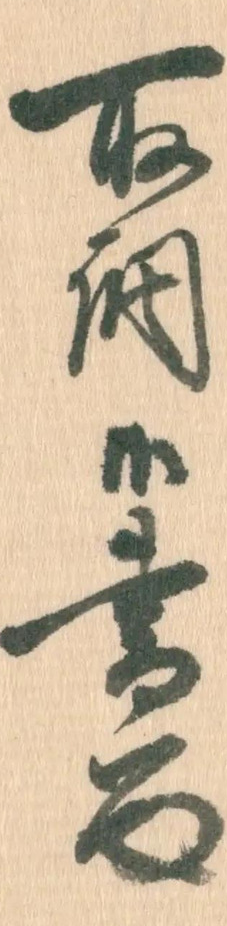取調候書面
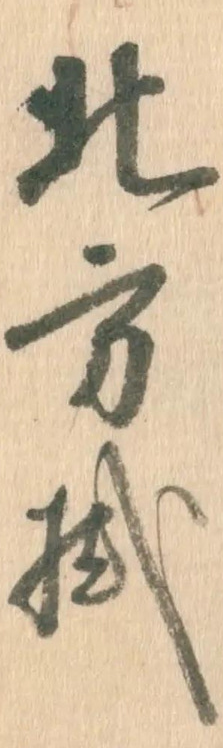北方掛

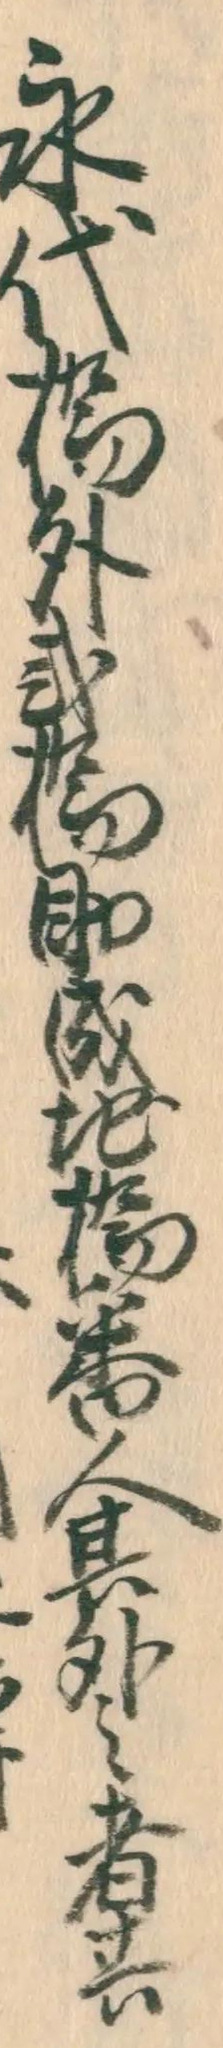永代橋外弐橋助成地橋番人其外之者共
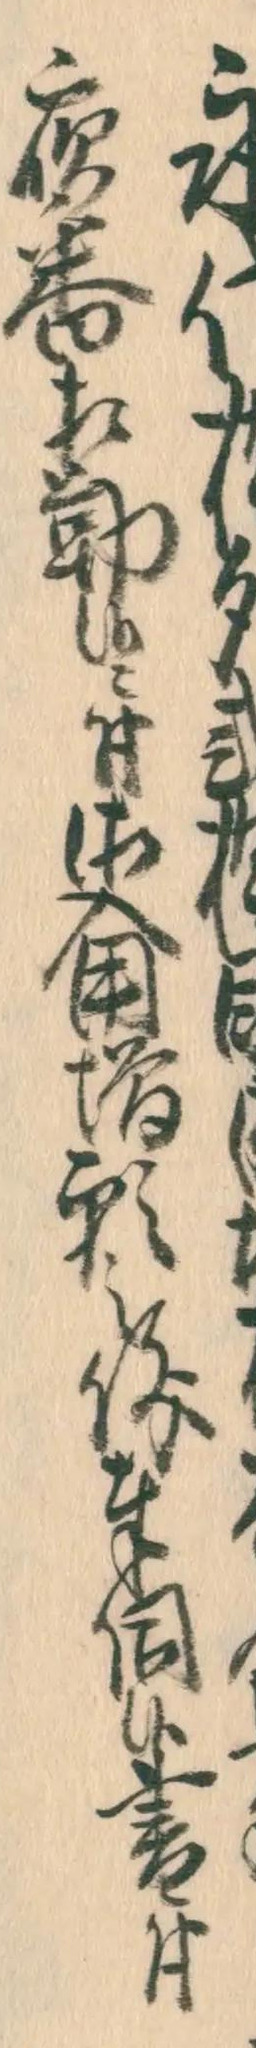夜番相勤候ニ付御入用増願之儀奉伺候書付
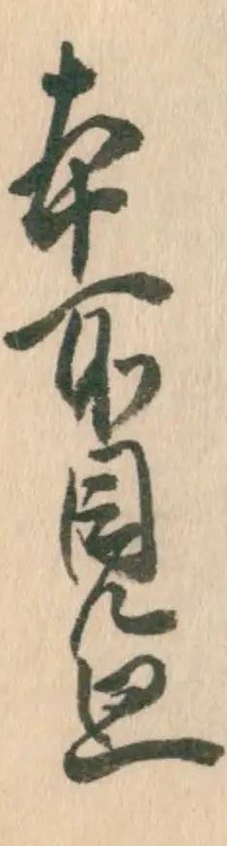本所見廻

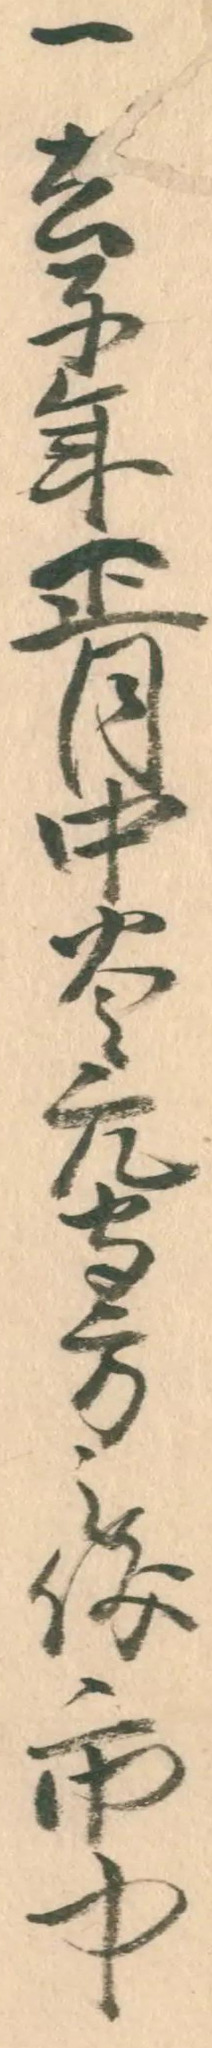一去子年正月中火之元守方之儀市中
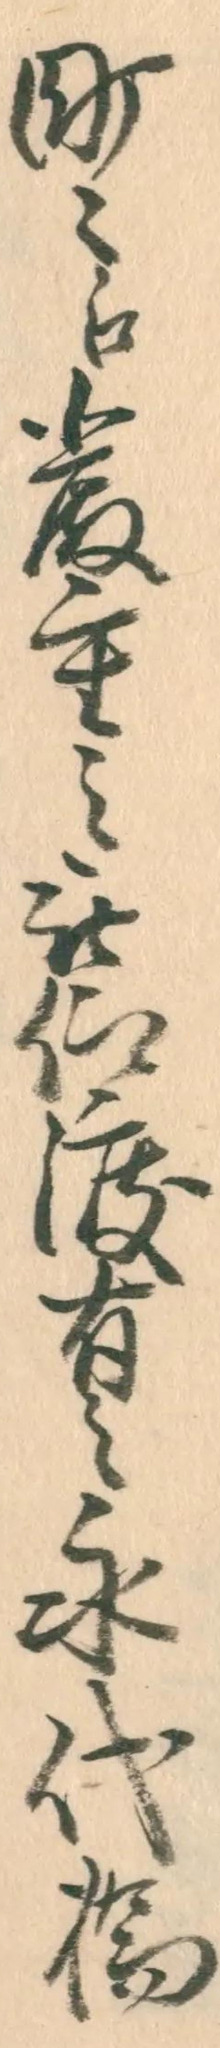町々え厳重之被仰渡有之永代橋
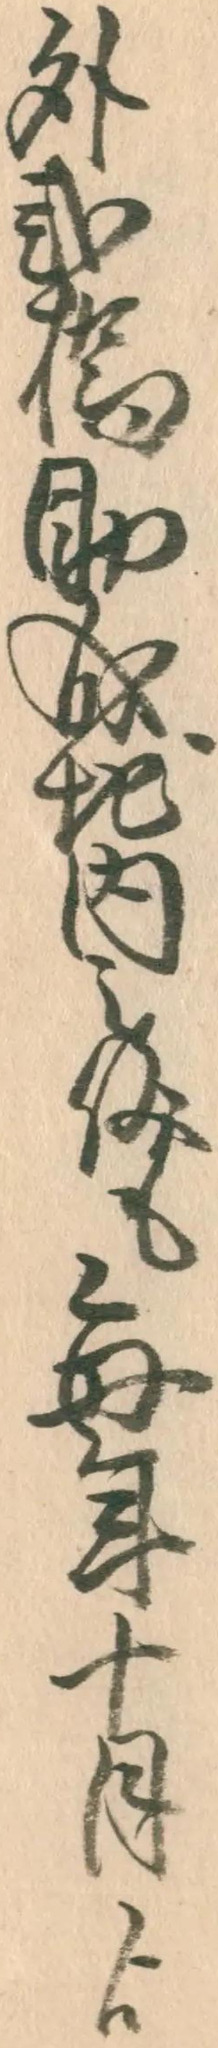外弐橋助成地内之儀も毎年十月ゟ
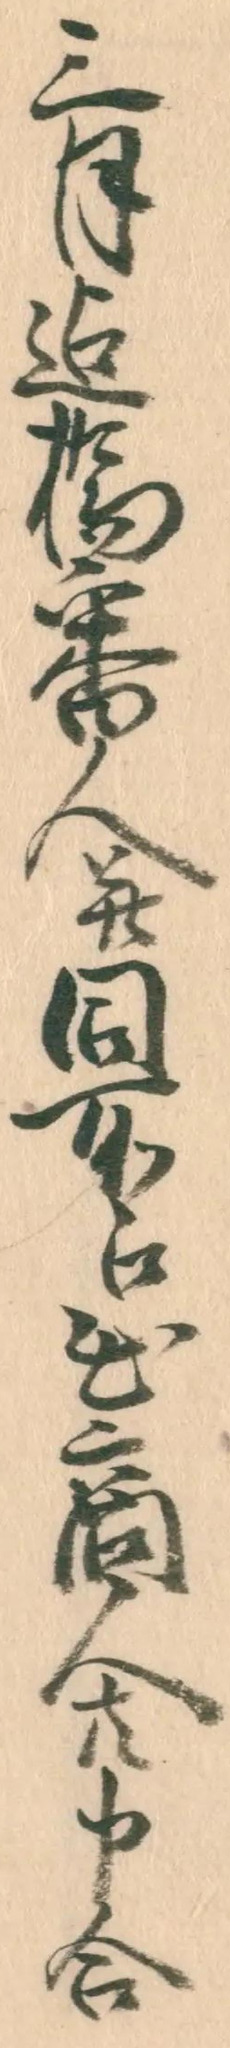三月迄橋番人并同所え出商人共申合
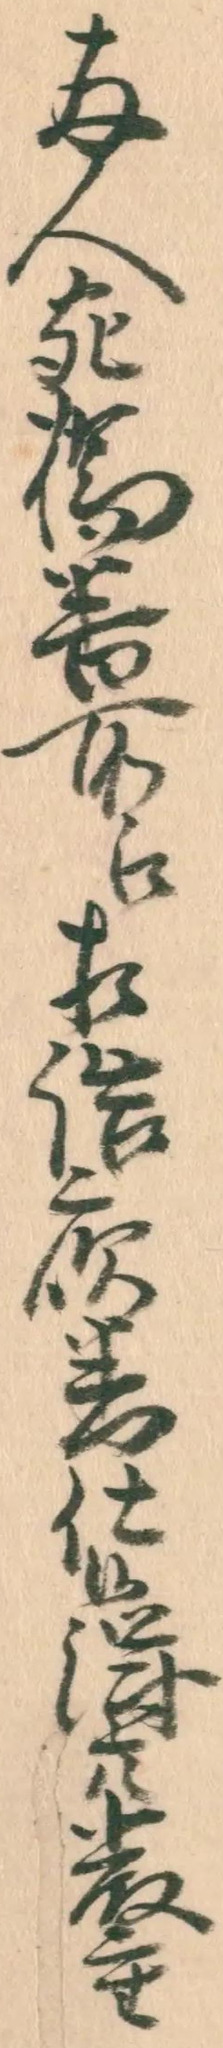両人宛橋番所え相詰夜番仕候得共厳重
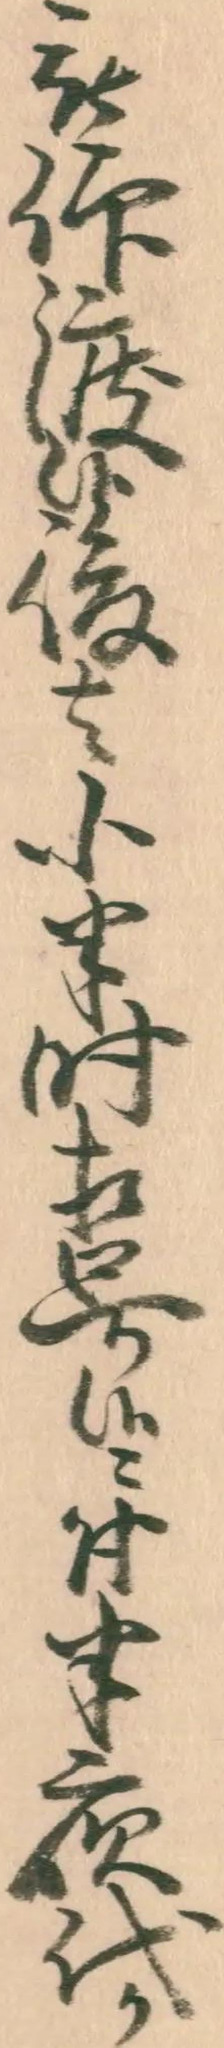被仰渡候後は小半時相廻り候ニ付半夜代り
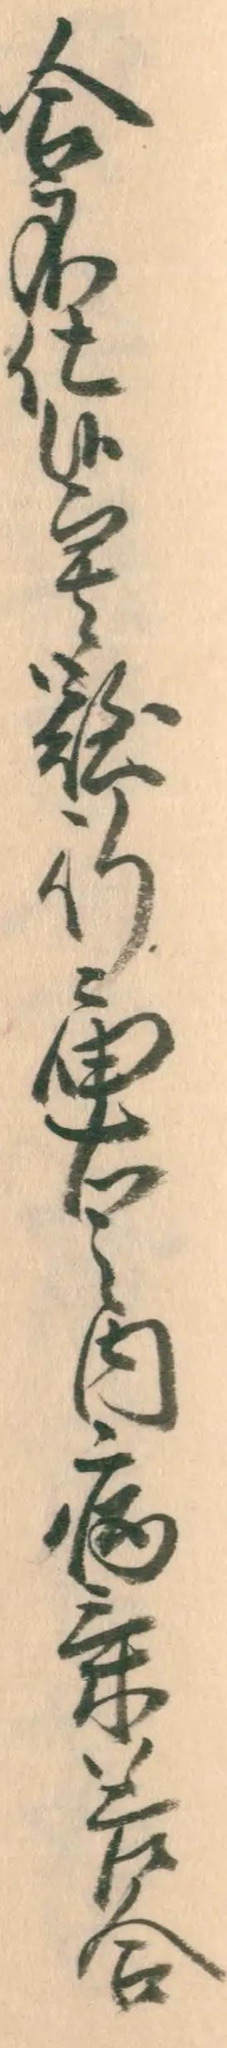合不仕候而は難行届右之内病気差合
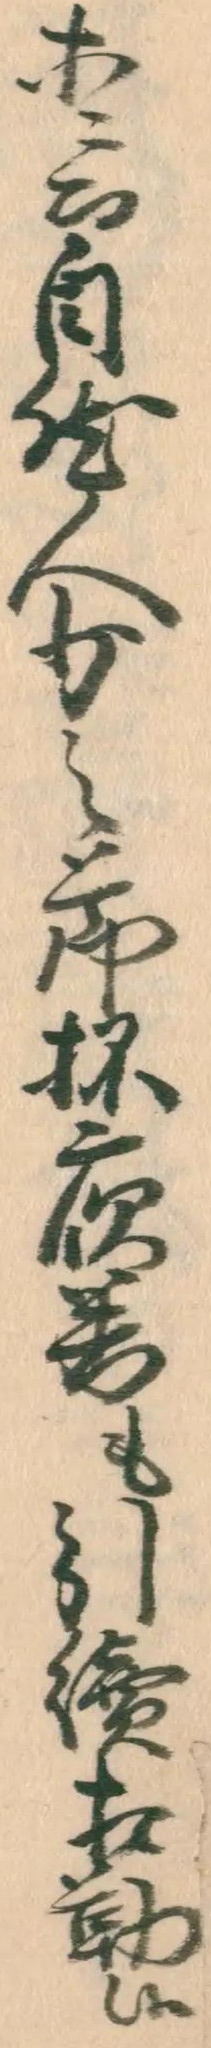等ニ而自然人少之節抔夜番も引続相勤候
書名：三橋 17巻. [7] 三橋小破御修復書留　但御奉行御掛リ替地震潰橋番屋　嘉永四亥年より安政二卯年迄　上
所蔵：国立国会図書館 National Diet Library, JAPAN
